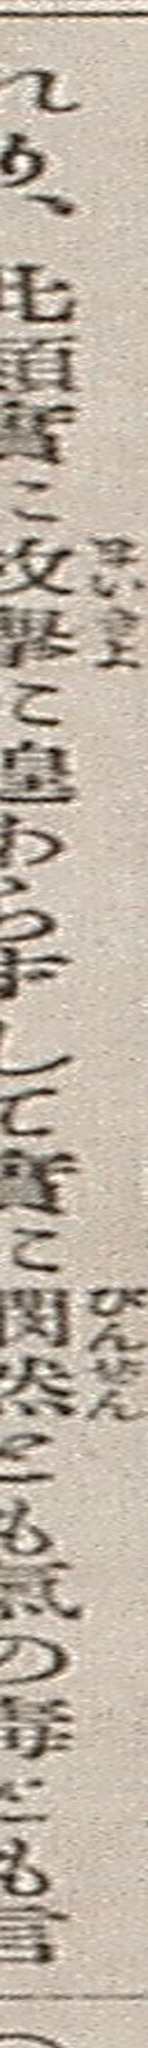れり、此類実に枚挙に遑あらずして実に憫然とも気の毒とも言
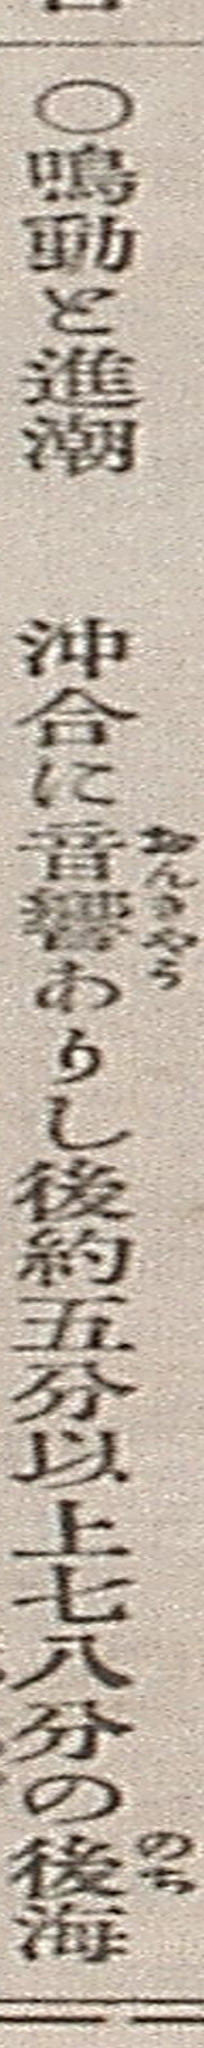○鳴動と進潮沖合に音響ありし後五分以上七八分の後海
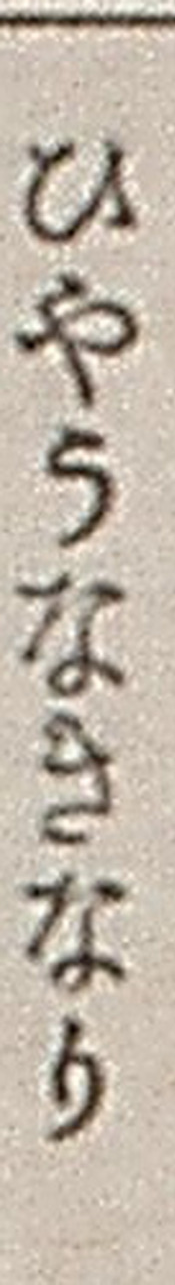ひやうなきなり
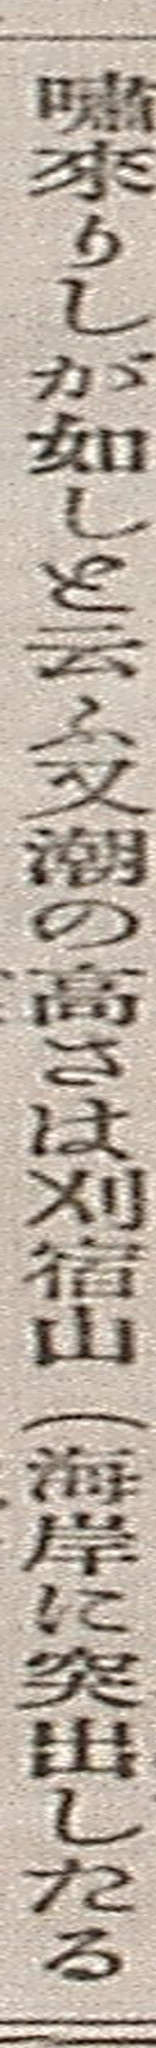嘯来りしが如しと云ふ又潮の高さは刈宿山したる
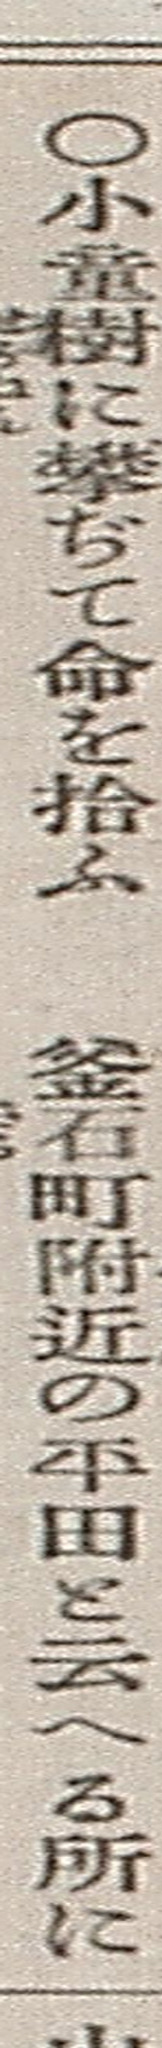○小童樹に攀ぢて命を拾ふ釜石町付近の平田と云へる所に
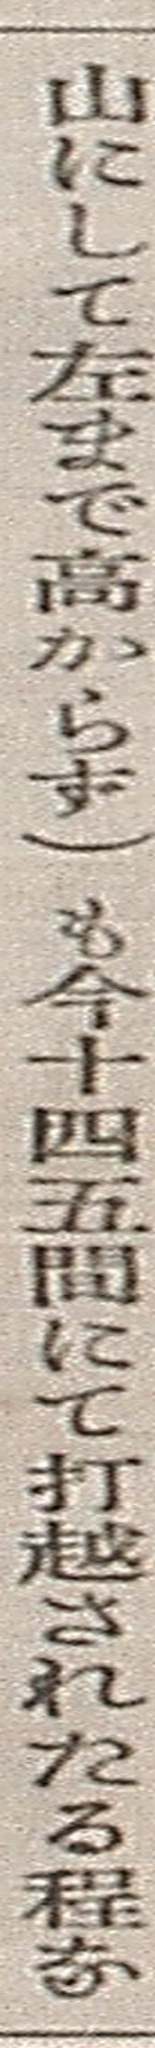山にして左まで高からず）も今十四五間にて打越されたる程な
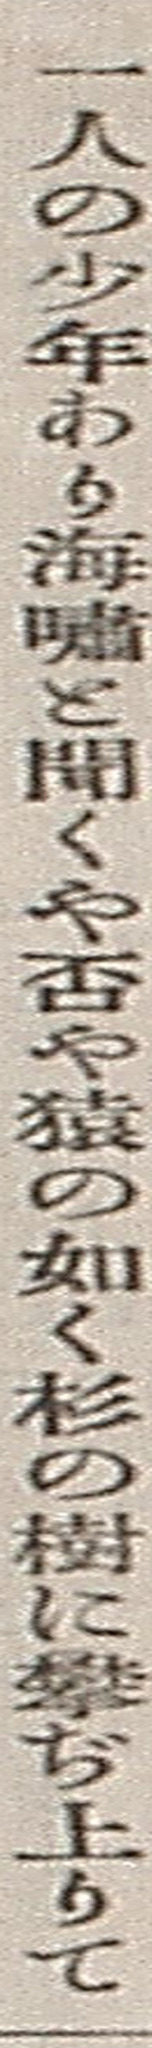一人の少年あり海嘯と聞くや否や猿の如く杉の樹に攀ぢ上りて
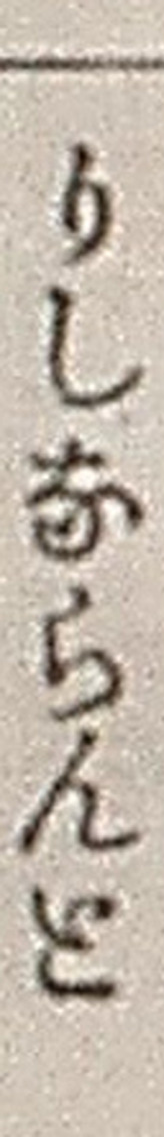りしならんと
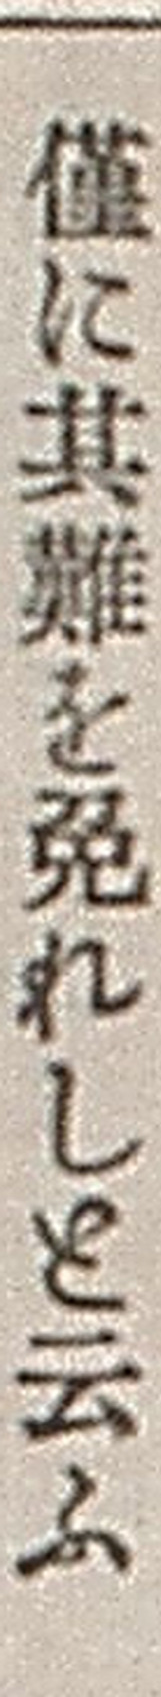僅に其難を免れしと云ふ
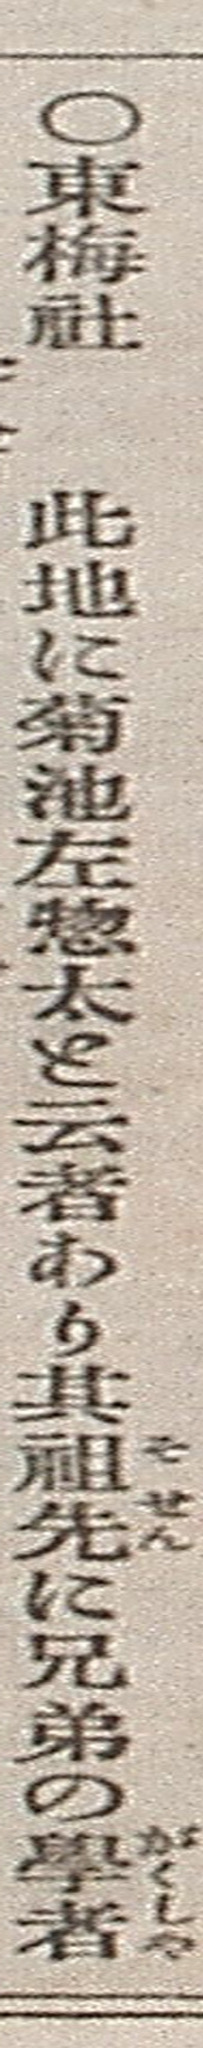○東梅社此地に菊池左惣太と云者あり其祖先に兄弟の学者
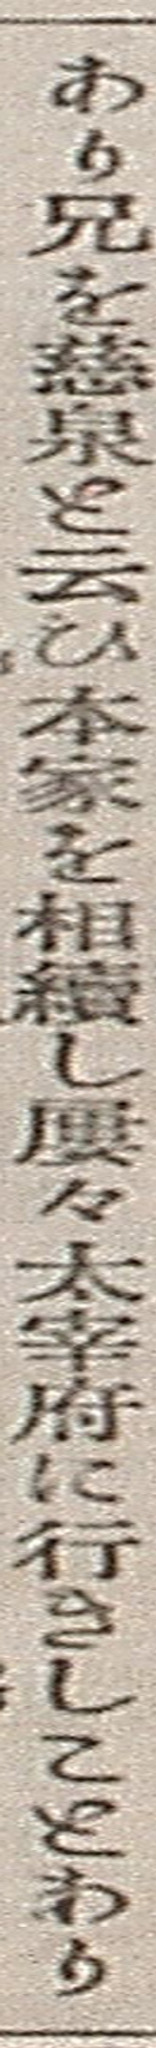あり兄を慈泉と云ひ本家を相続し屡々大宰府に行きしことあり
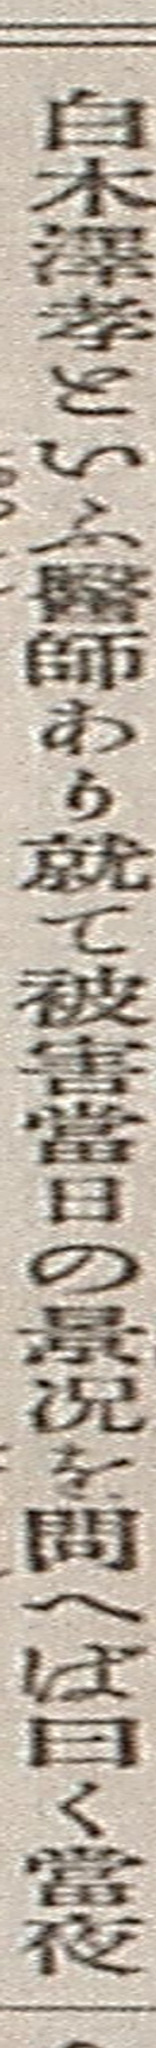白木沢孝といふ医師あり就て被害当日の景况を問へば曰く当夜
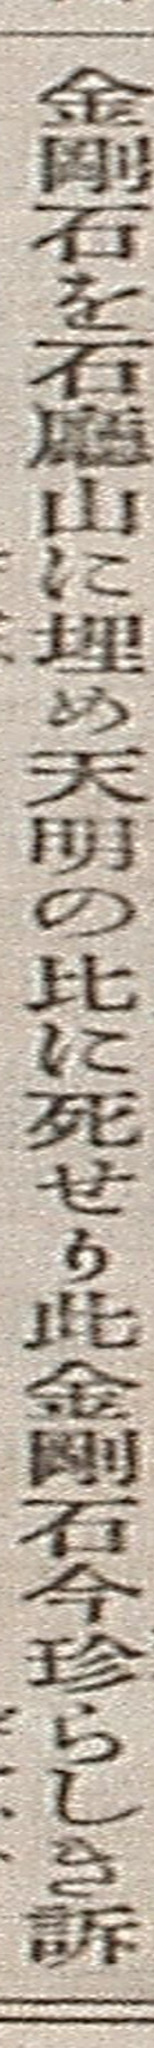金剛石を石聴山に埋め天明の比に死せり此金剛石今珍らしき訴
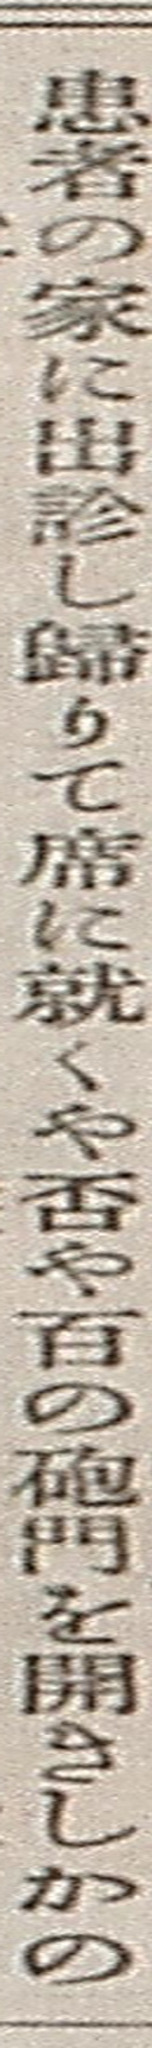患者の家に出診し帰りて席に就くや否や百の砲門を開きしかの
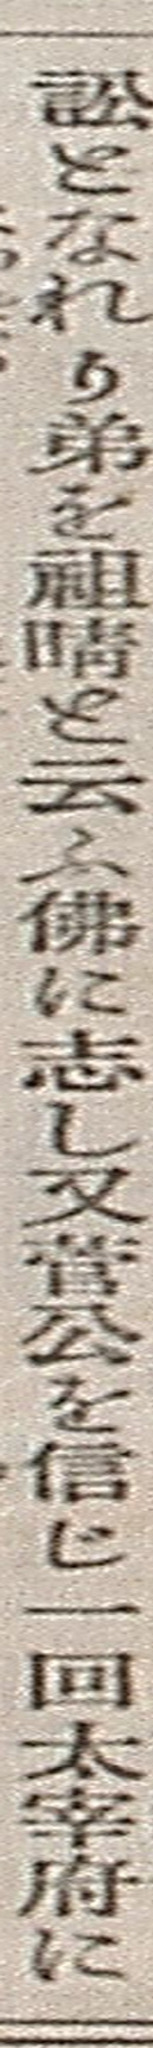訟となれり弟を祖晴と云ふ仏に志し又菅公を信じ一回大宰府に
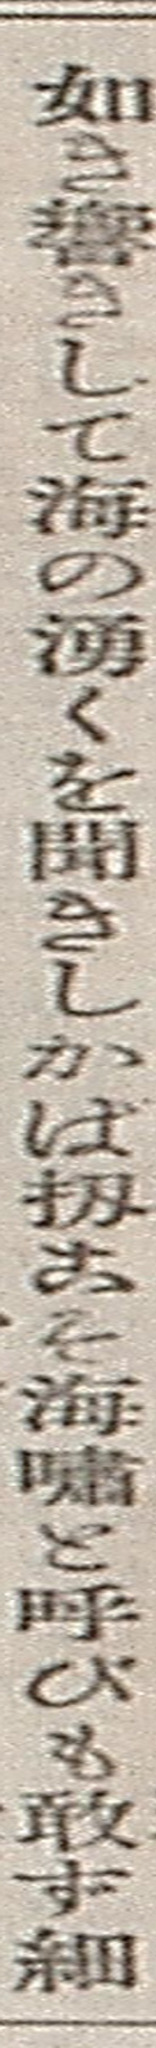如き響きして海の湧くを聞きしかば扨こそ海嘯と呼びも敢ず細
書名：風俗畫報臨時増刊第百十九號　大海嘯被害録（中）
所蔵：東京大学地震研究所図書室 Earthquake Research Institute Library, The University of Tokyo, JAPAN
